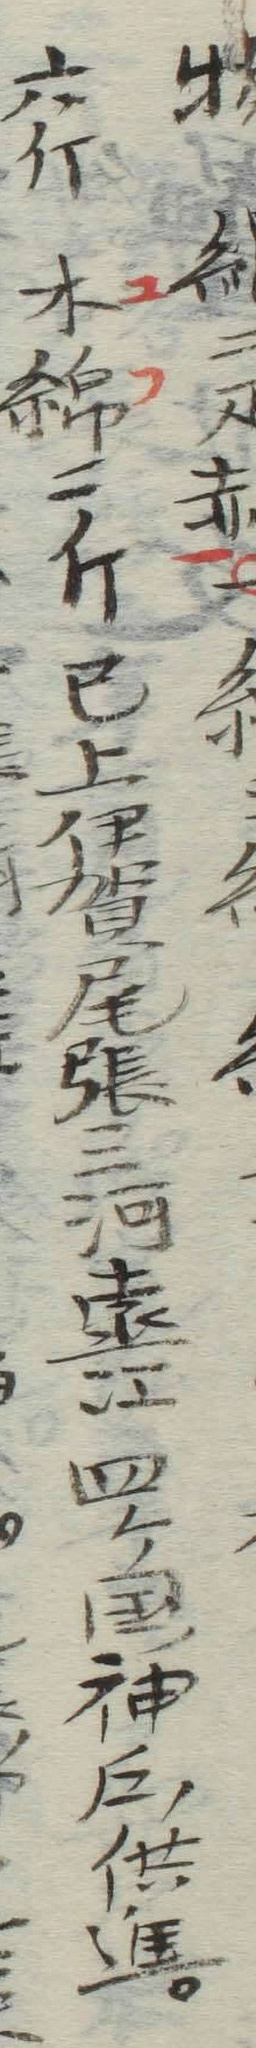六斤木綿二斤已上伊賀尾張三河遠江四ケ国神戸供進。
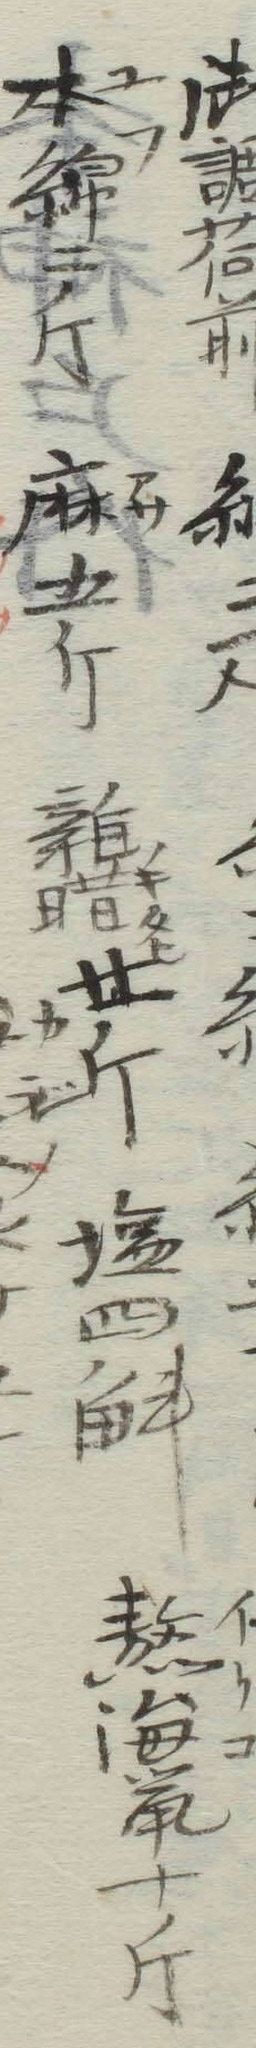本綿二斤麻五斤雑腊廿斤塩四斛熬海鼡十斤
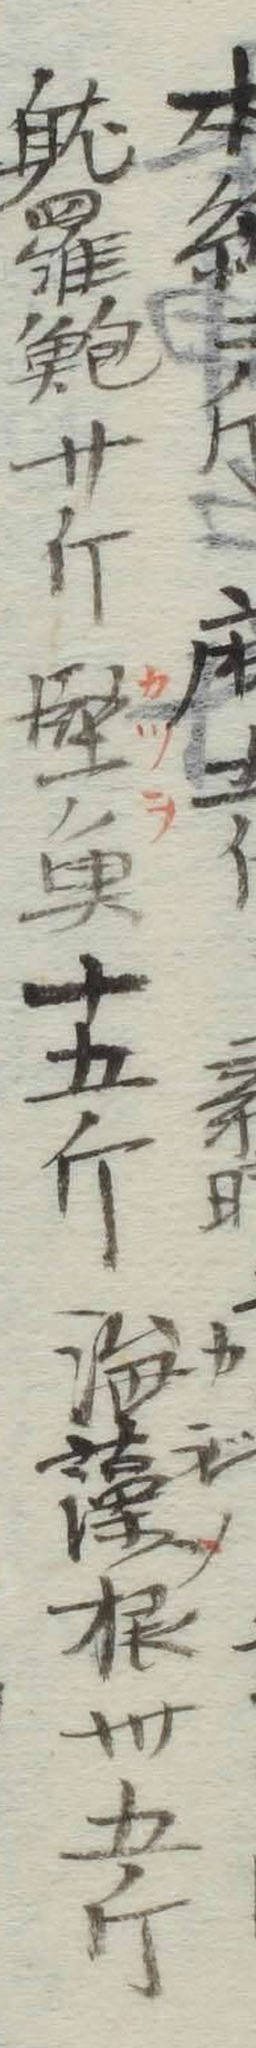耽羅鮑廿斤堅魚」十五斤海藻根丗五斤

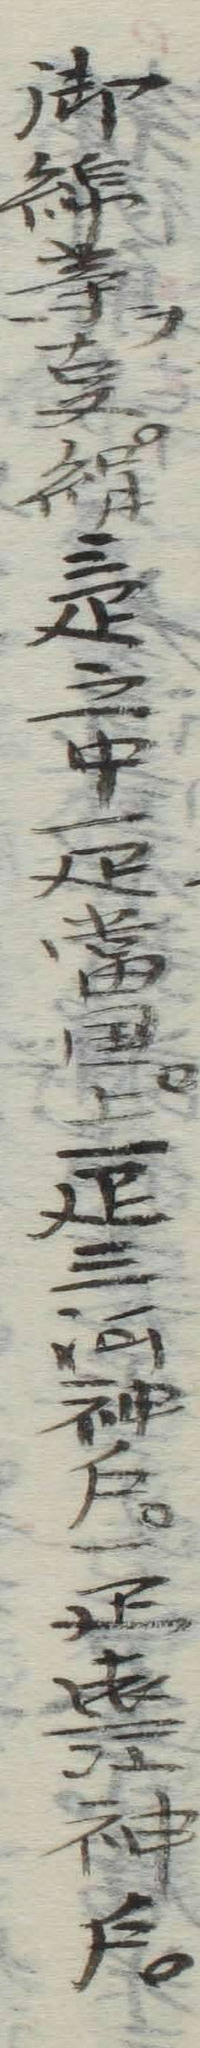御綿等事。絹三疋之中一疋当国。上一疋三河神戸。一疋遠江神戸。
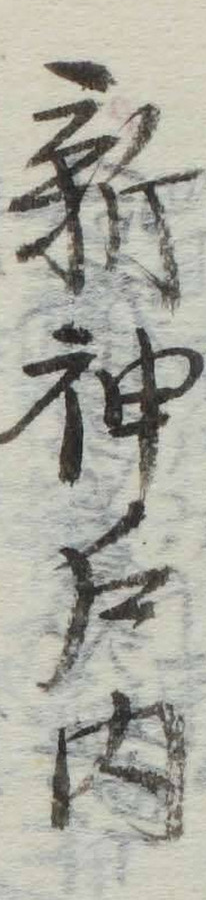新神戸内
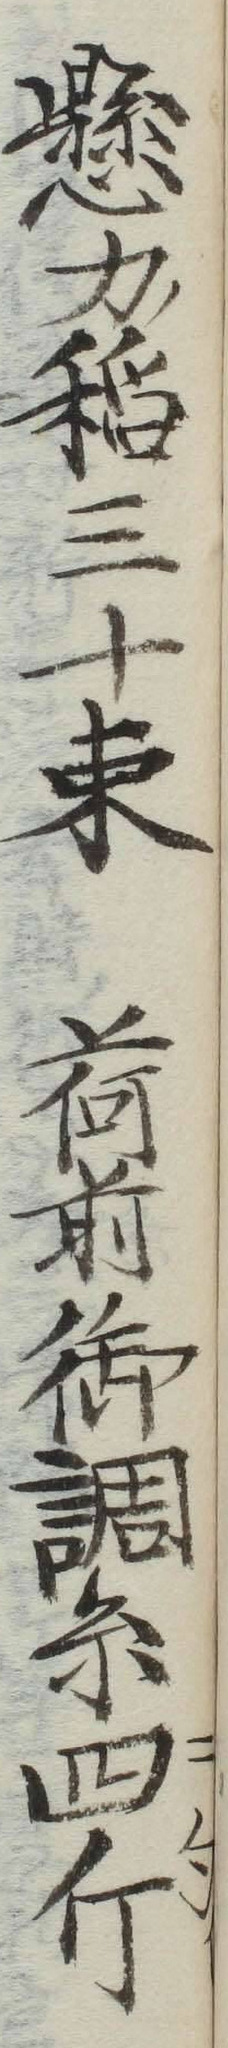懸力稲三十束荷前御調絲四斤
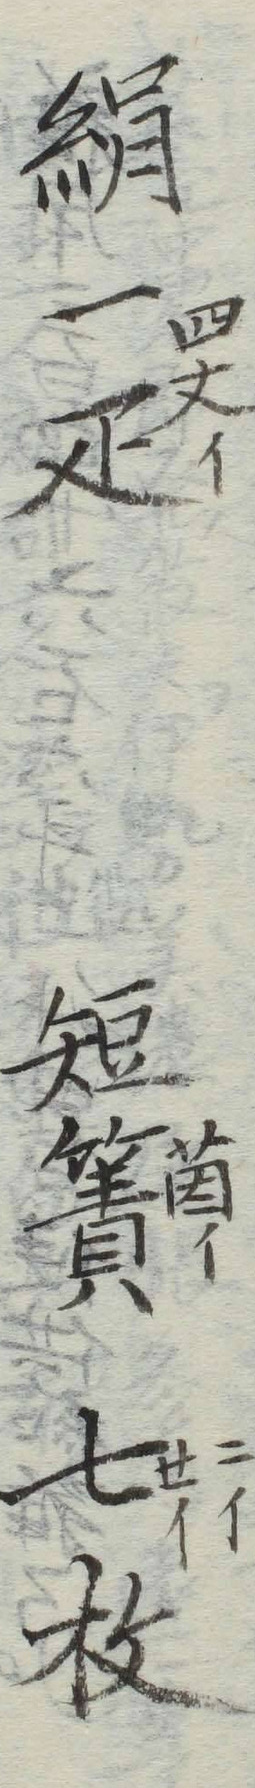絹一疋短簀七枚
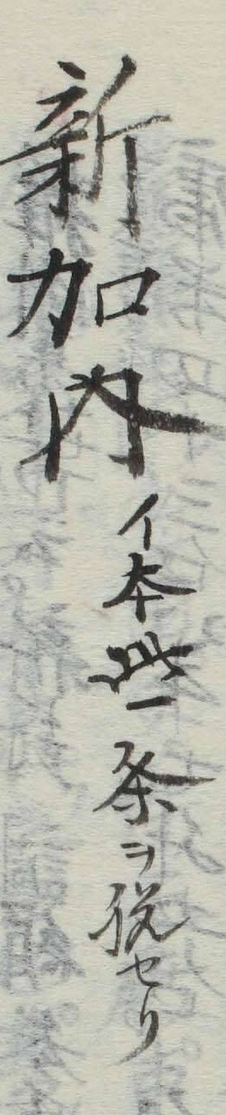新加内イ本此一条ヲ脱セリ
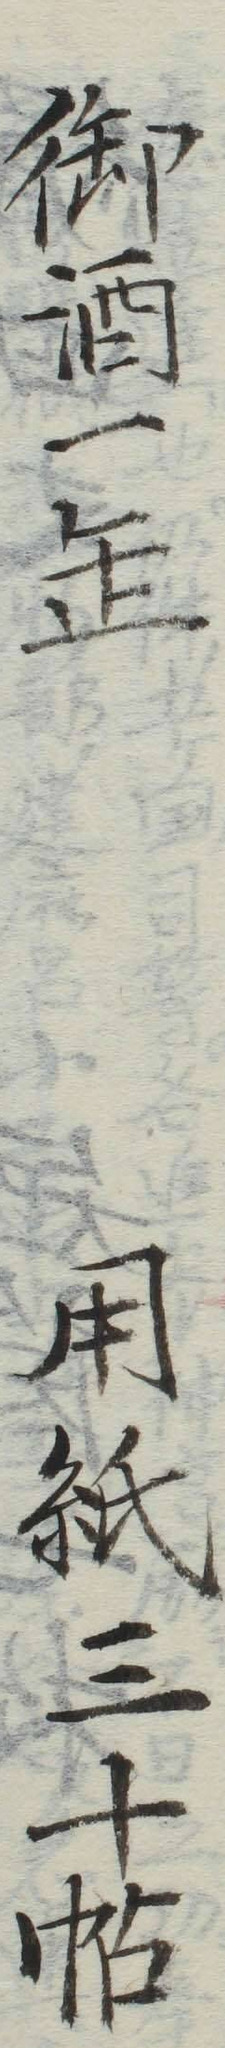御酒一缶用紙三十帖

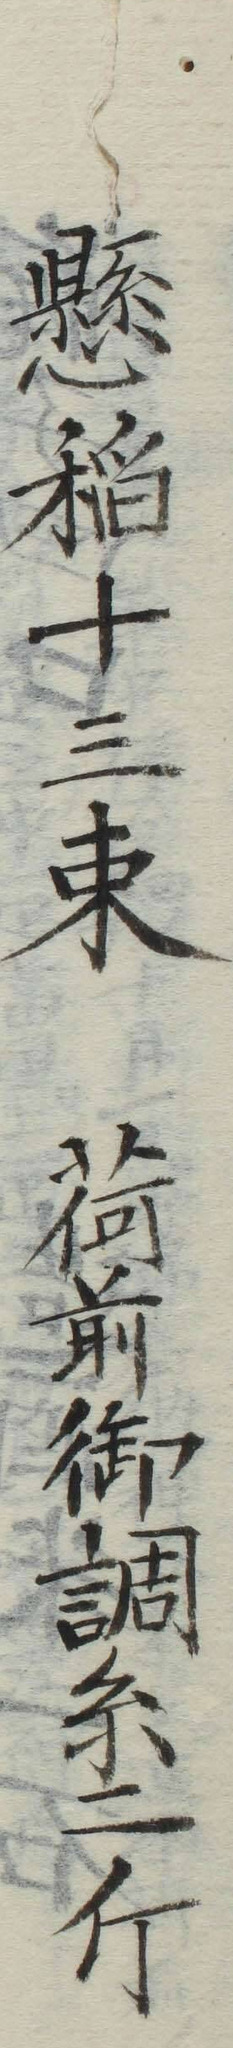懸稲十三束荷前御調糸二斤
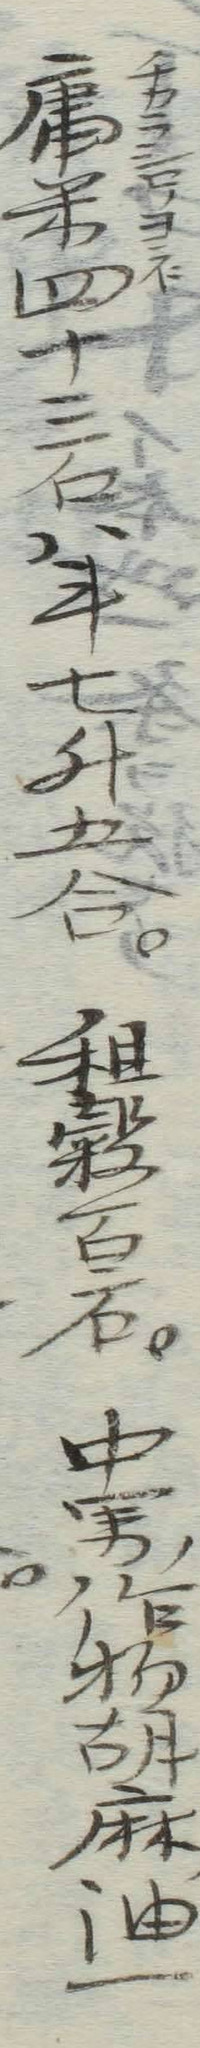庸米四十二石八斗七升五合。租穀百石。中男作物胡麻油一
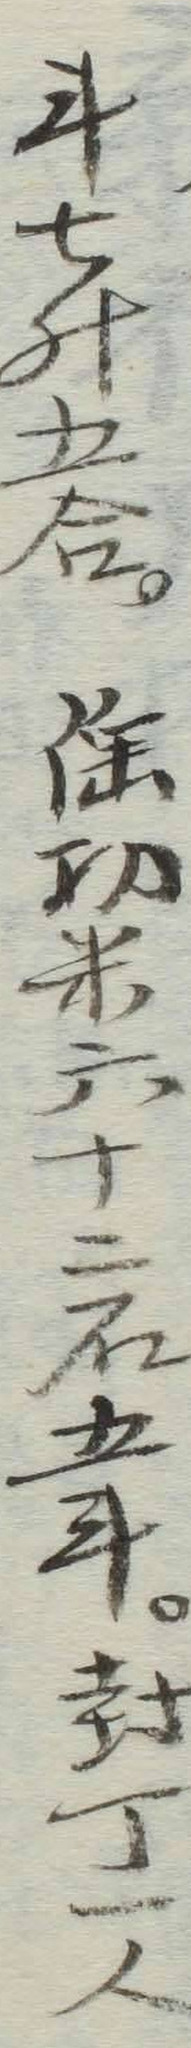斗七升五合。傜功米六十二石五斗。封丁一人。
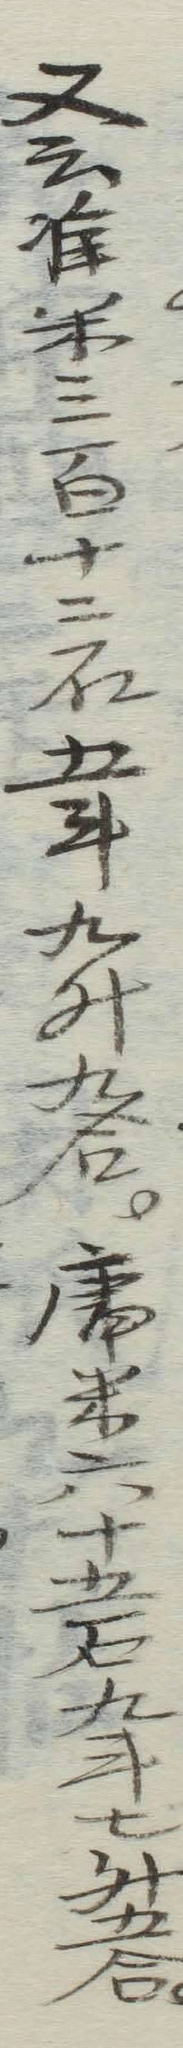又云准米三百十二石五斗九升九合。庸米六十五石九斗七升五合。
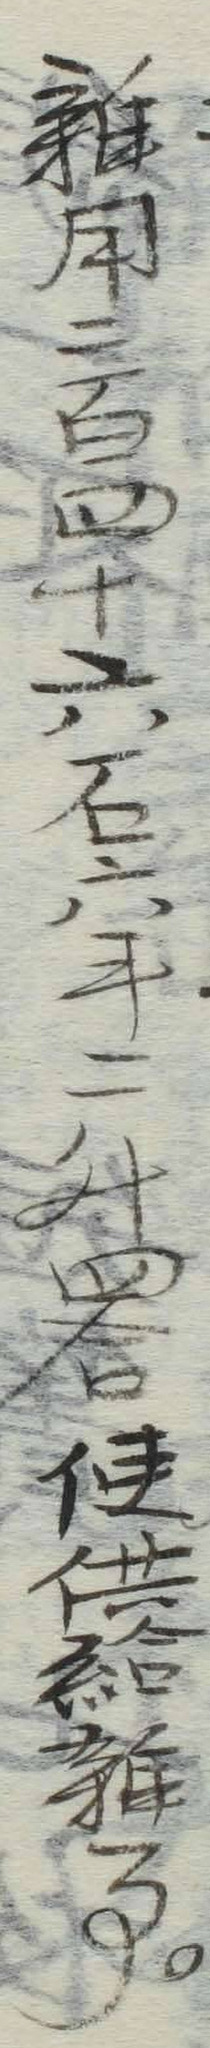雑用二百四十六石六斗二升四合使供給雑事。
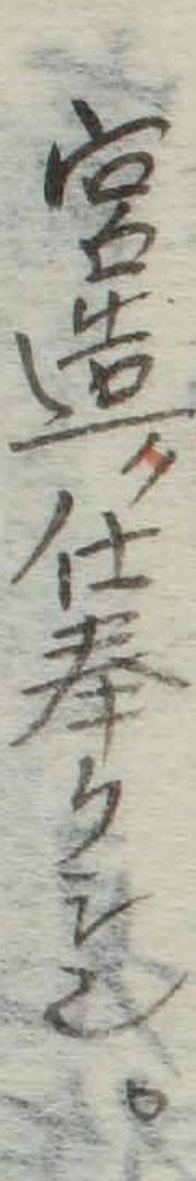宮造仕奉リシ也。

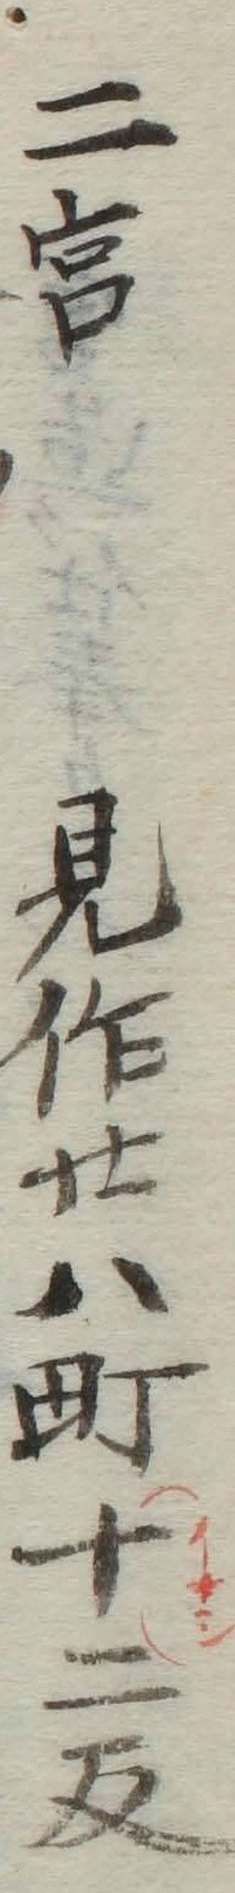二宮見作廿八町十二反
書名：神戸御厨御薗考
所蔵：国文学研究資料館
